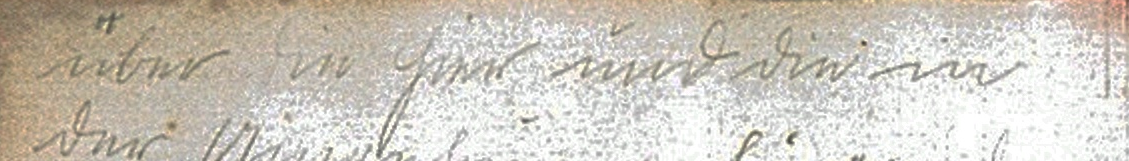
über die hier und die in
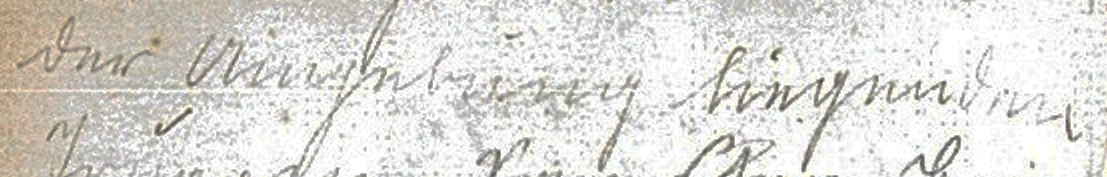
der Umgebung liegenden
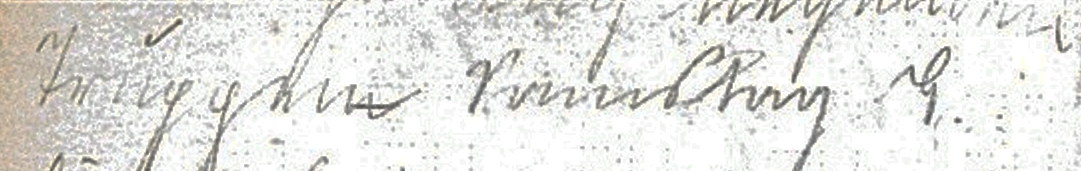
Truppenn. Samstag 9.
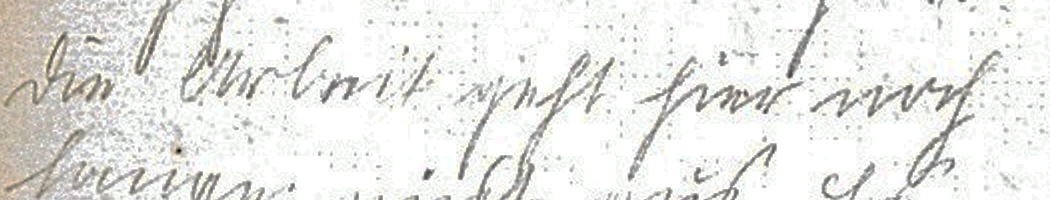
Die Arbeit geht hier noch
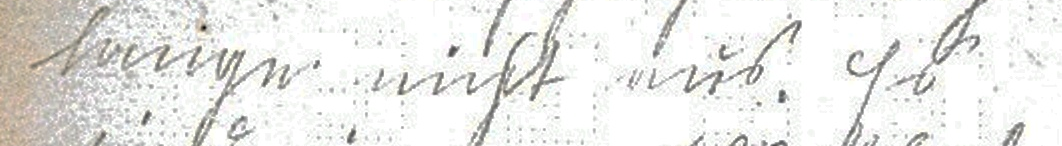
lange nicht aus. Es
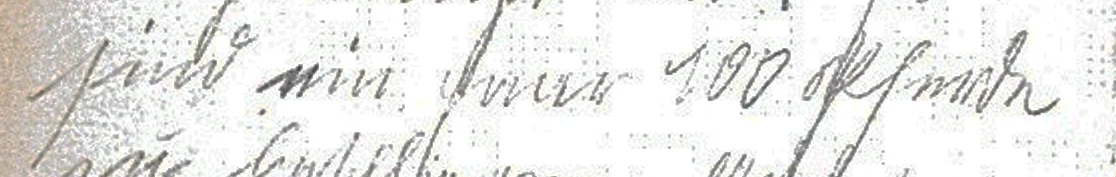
sind ein paar 100 Pferde
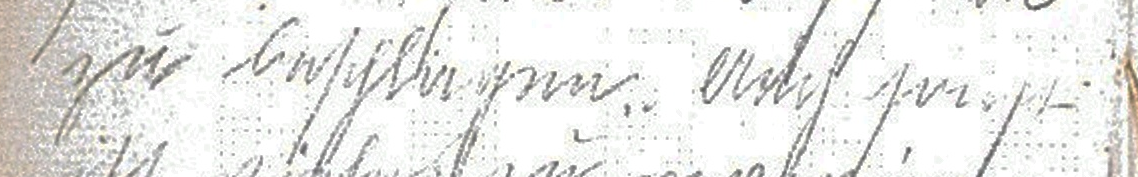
zu beschlagen. Auch sonst
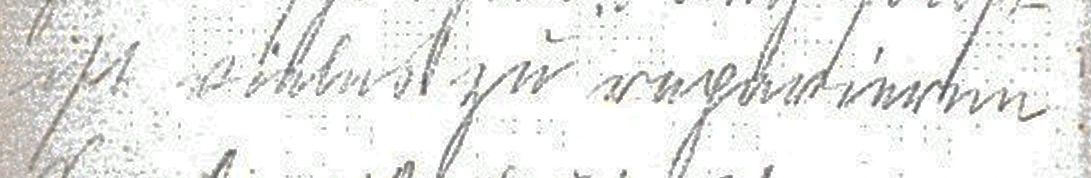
ist vieles zu reparieren.
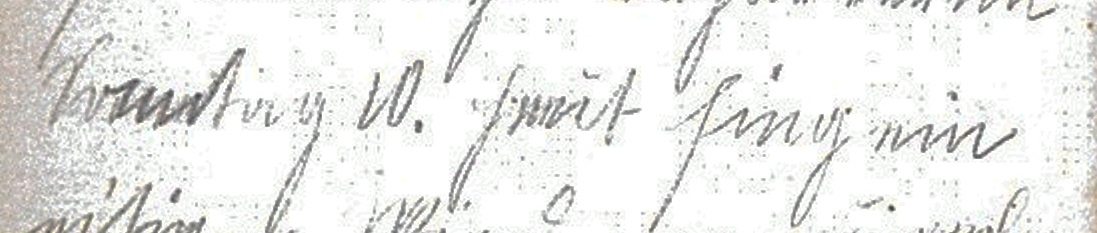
Sonntag 10. Heut fing ein
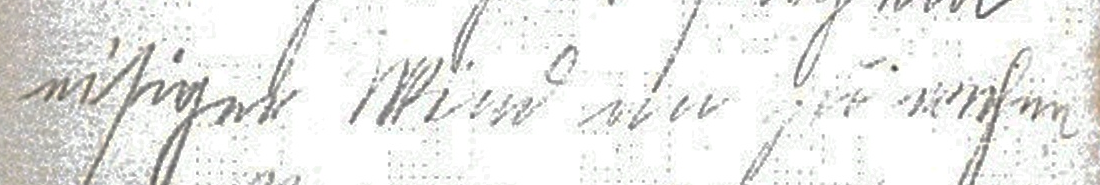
eisiger Wind an zu wehen
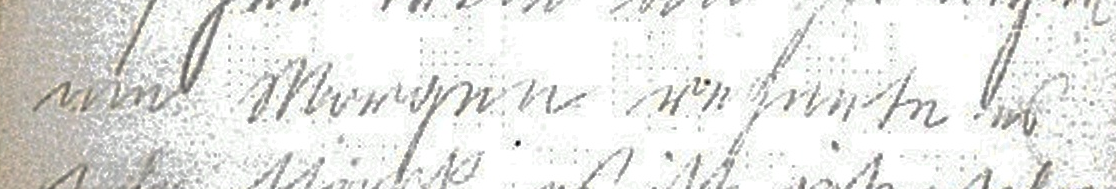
am Morgen regnete es
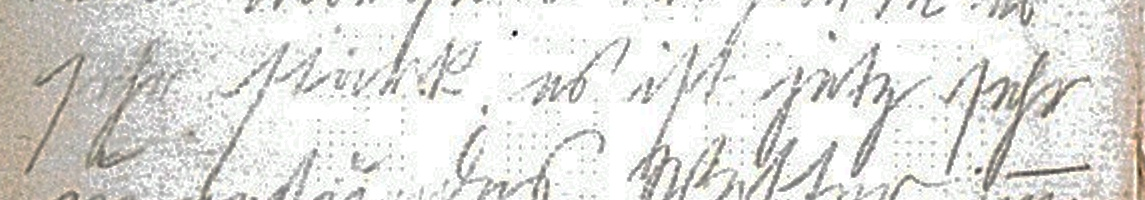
sehr stark es ist jetzt sehr
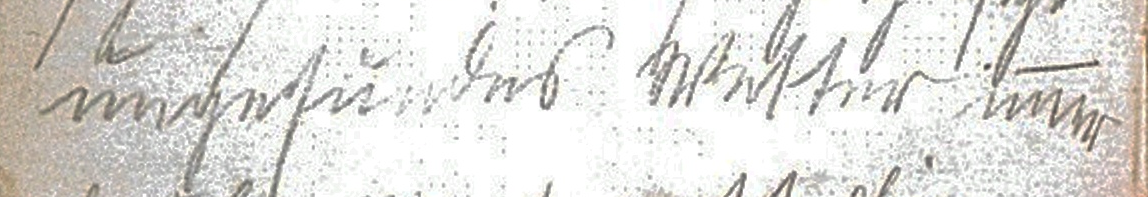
ungesundes Wetter immer
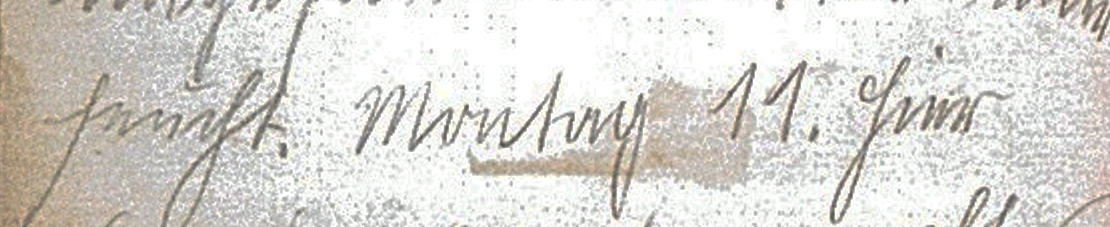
feucht. Montag 11. hier
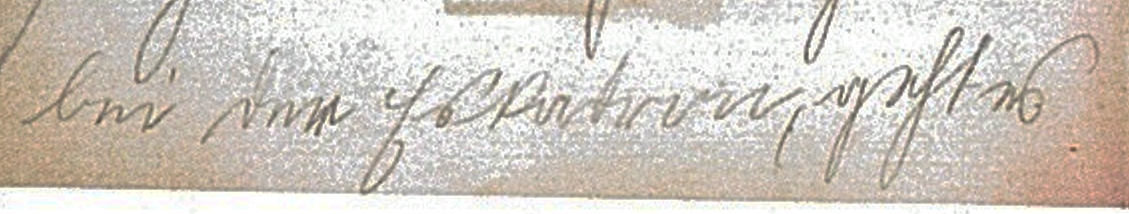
bei der Eskadron geht es
